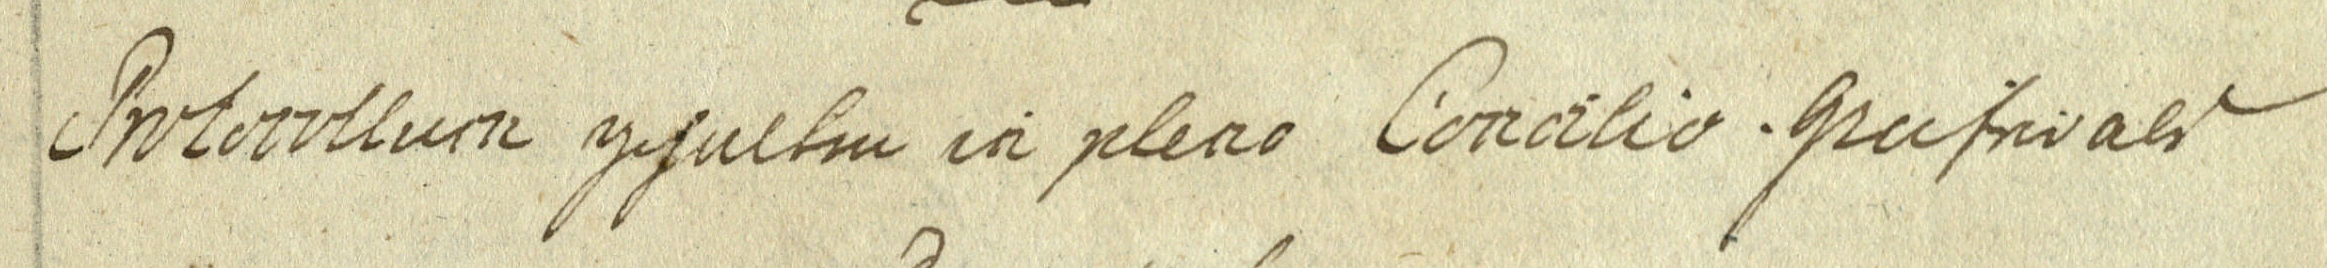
Protocollum gehalten in pleno Concilio Greifswald
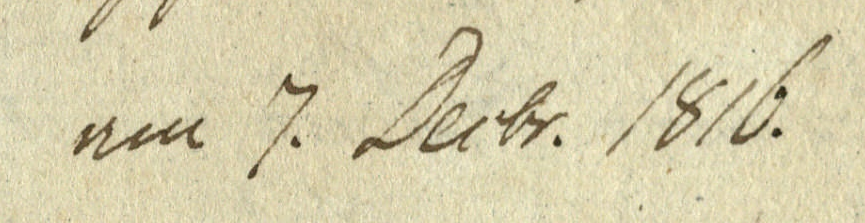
am 7. Decbr. 1816.
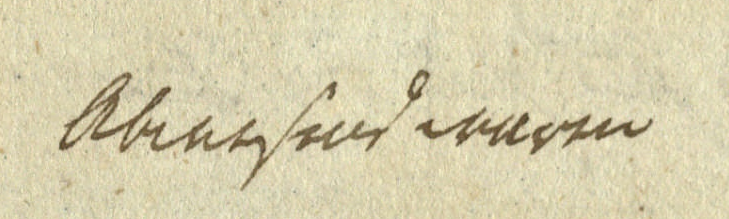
Abwesend waren
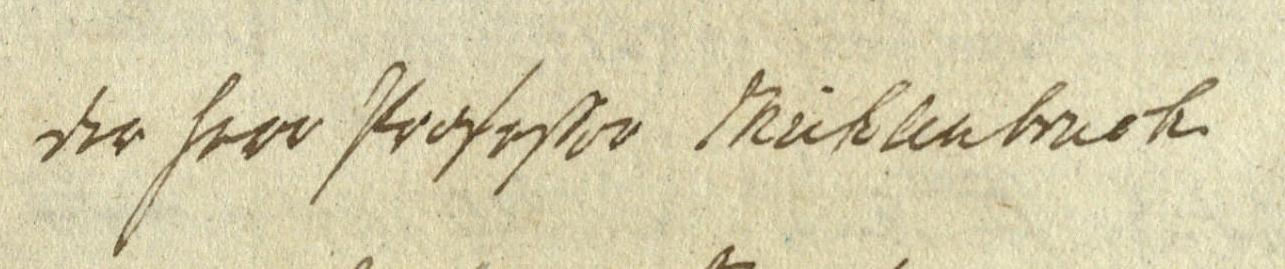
der Herr Professor Mühlenbruch.
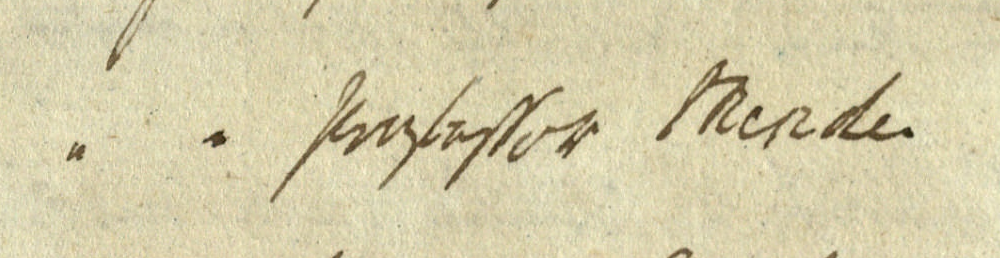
Professor Mende.
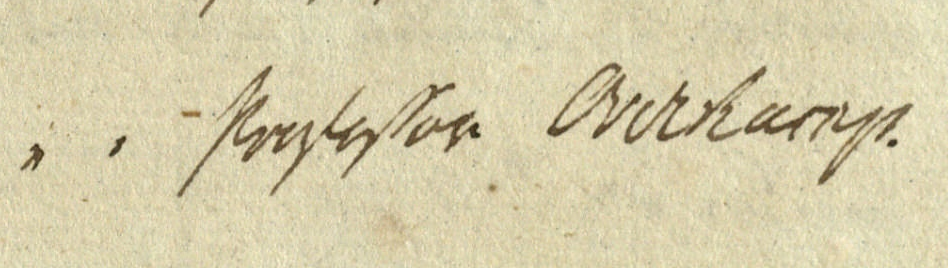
Professor Overkamp.
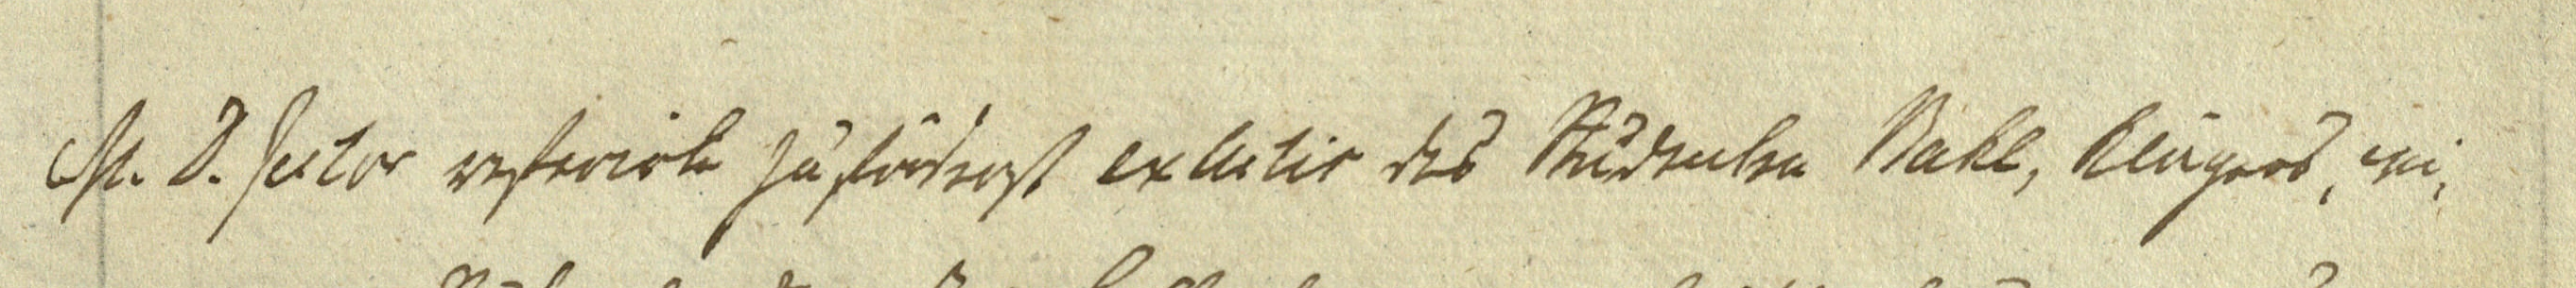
M. D. Rector referirte zuförderst ex actis des Studenten Bahl, Klägers, wi¬
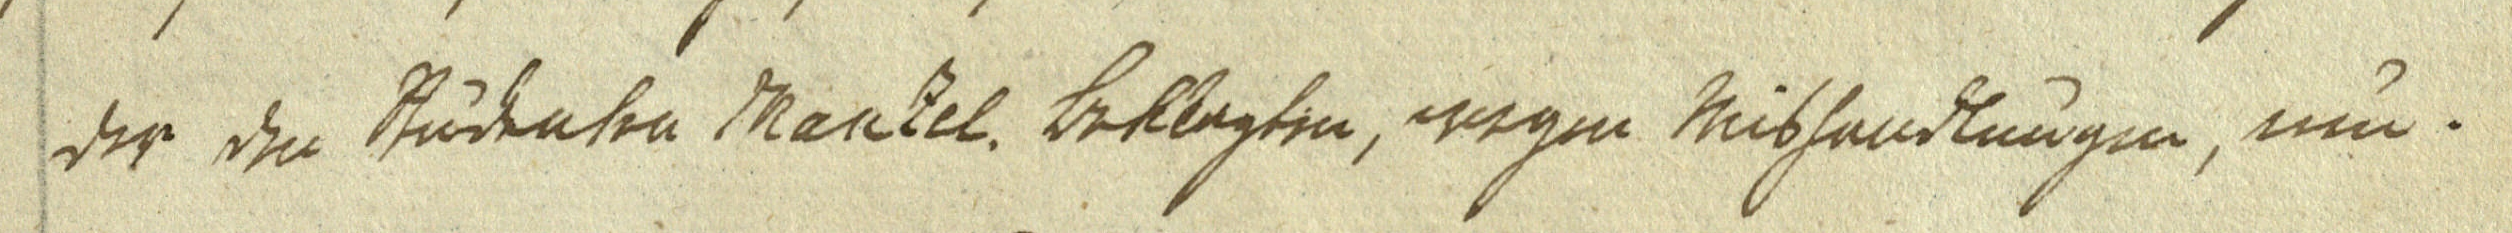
der den Studenten Manzel Beklagten, wegen Mishandlungen, um¬
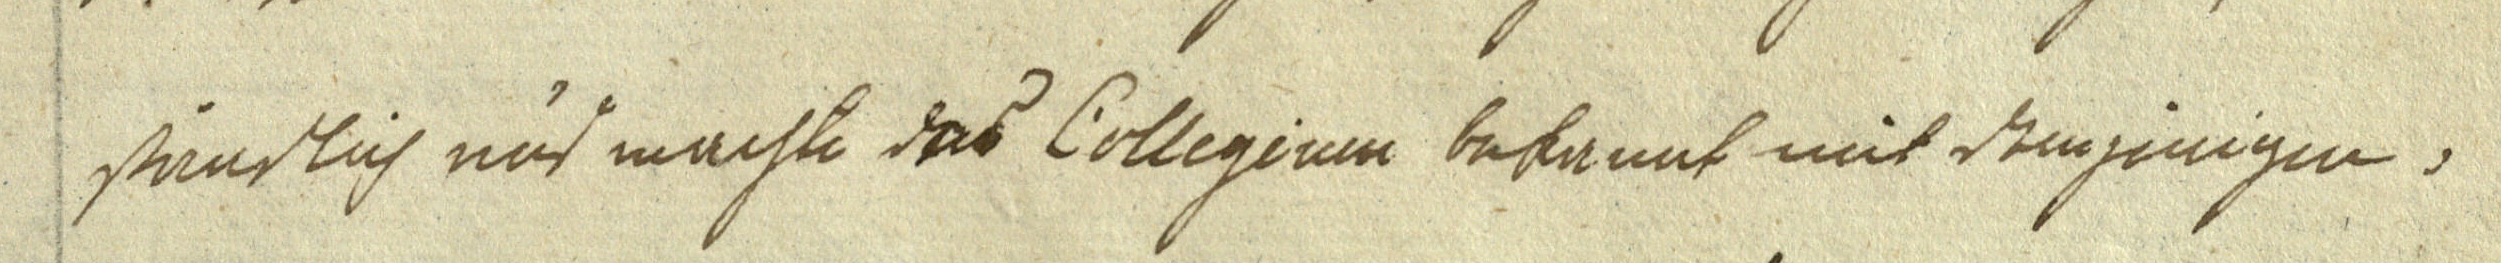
ständlich und machte das Collegium bekannt mit demjenigen,
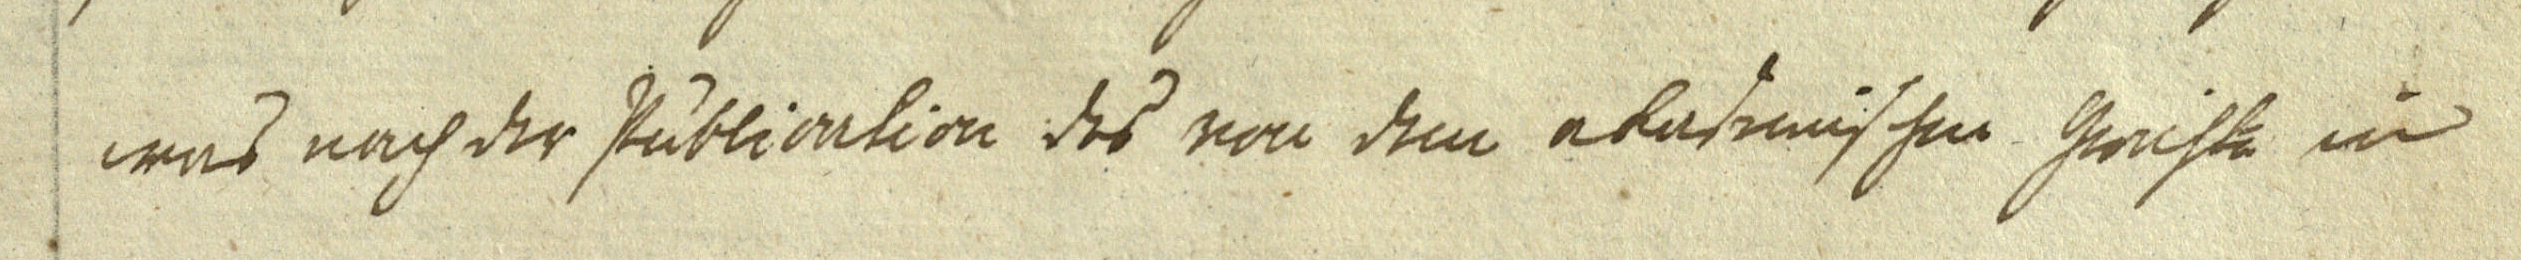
was nach der Publication des von dem akademischen Gerichte in
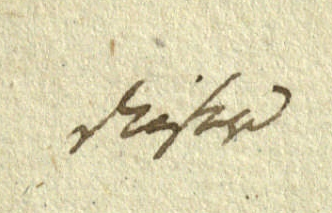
dieser
